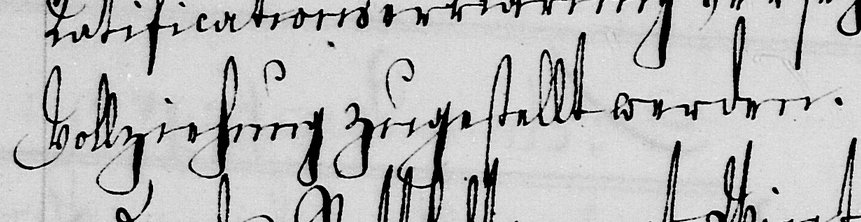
Vollziehung zugestellt werden.
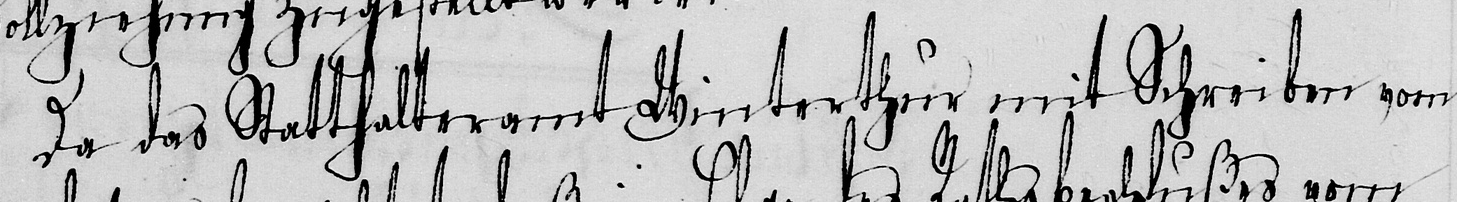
Da das Statthalteramt Winterthur mit Schreiben vom
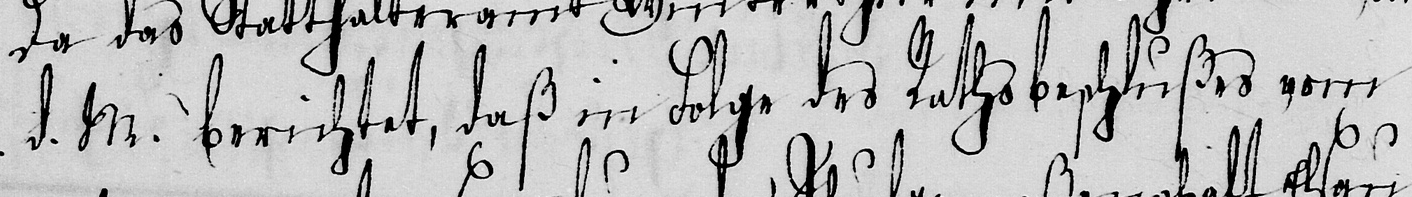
d. M. berichtet, daß in Folge des Rathsbeschlußes vom
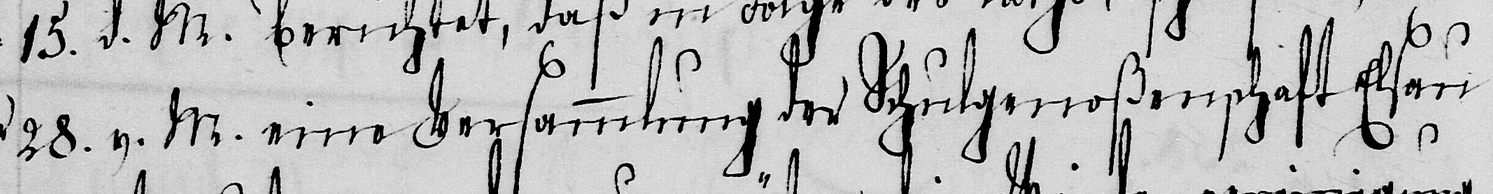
28. v. M. eine Versammlung der Schulgenoßenschaft Elsau
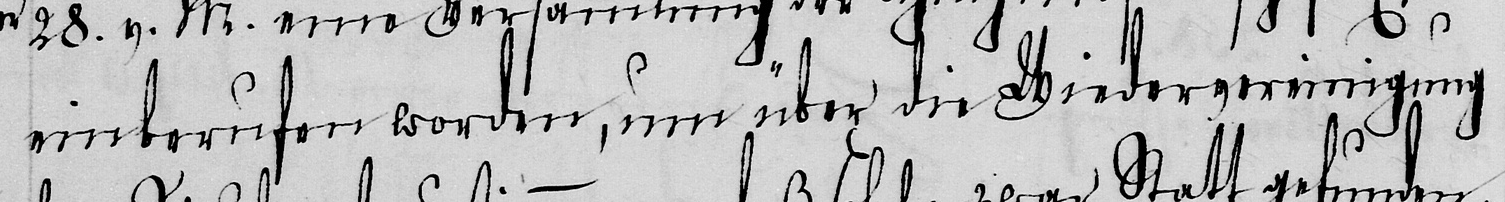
einberufen worden, um über die Wiedervereinigung
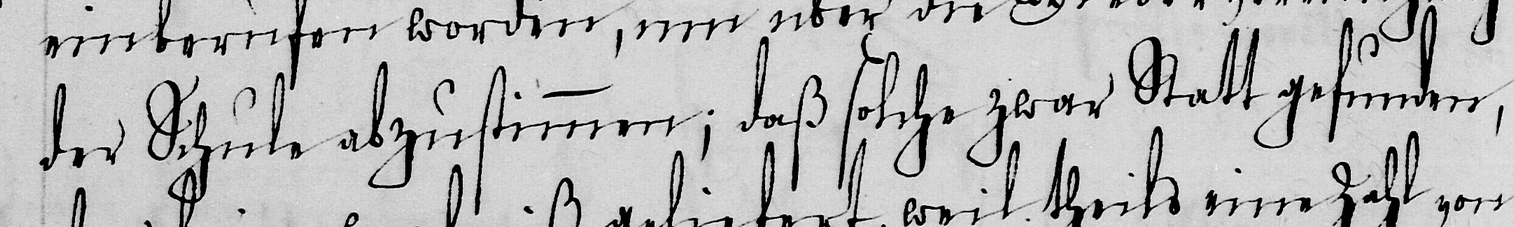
der Schule abzustimmen; daß solche zwar Statt gefun¬
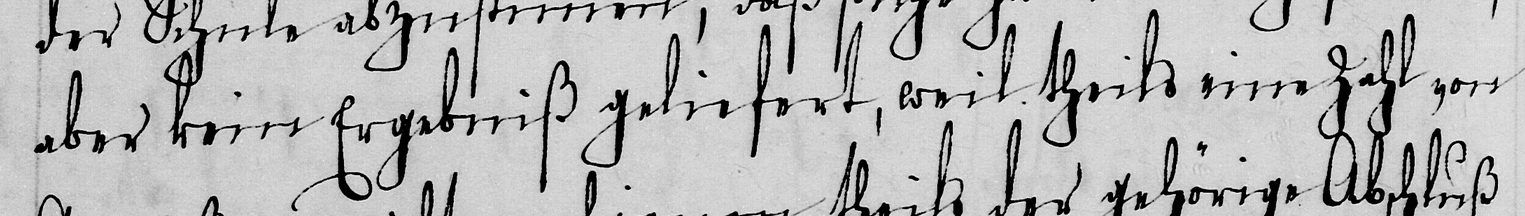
aber kein Ergebniß geliefert, weil theils eine Zahl von
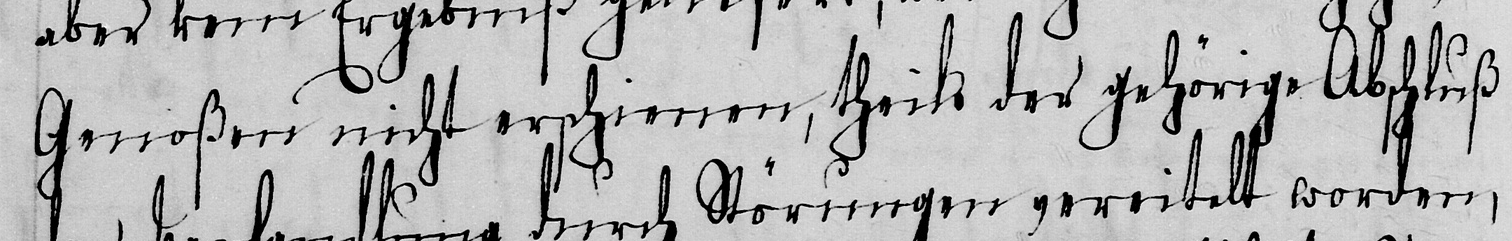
Genoßen nicht erschienen, theils der gehörige Abschluß
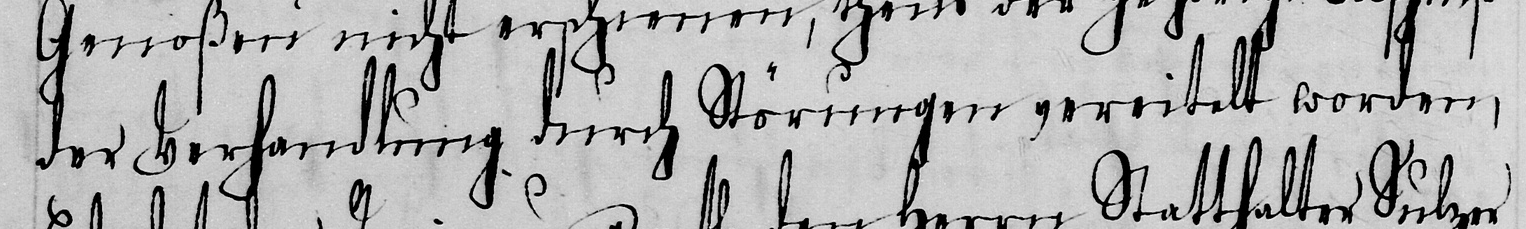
der Verhandlung durch Störungen vereitelt worden,
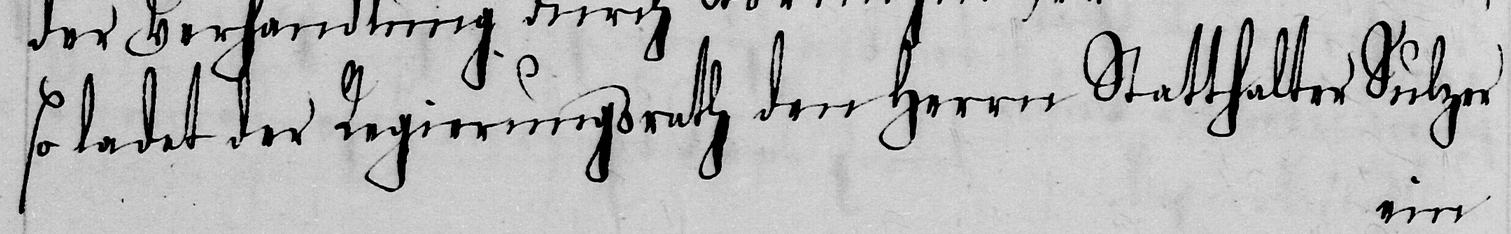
so ladet der Regierungsrath den Herrn Statthalter Sulzer
